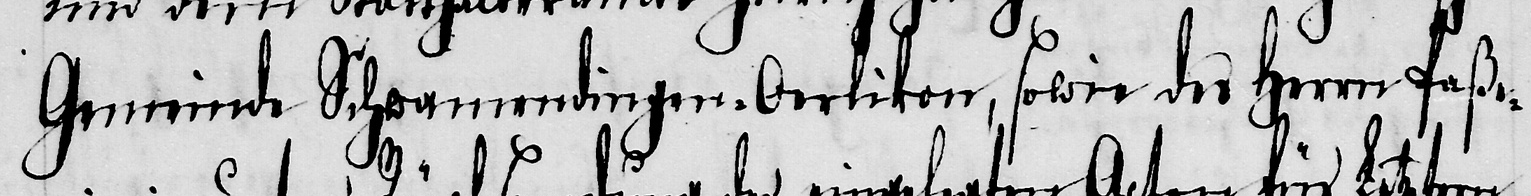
Gemeinde Schwamendingen-Oerlikon, sowie des Herrn Paße¬
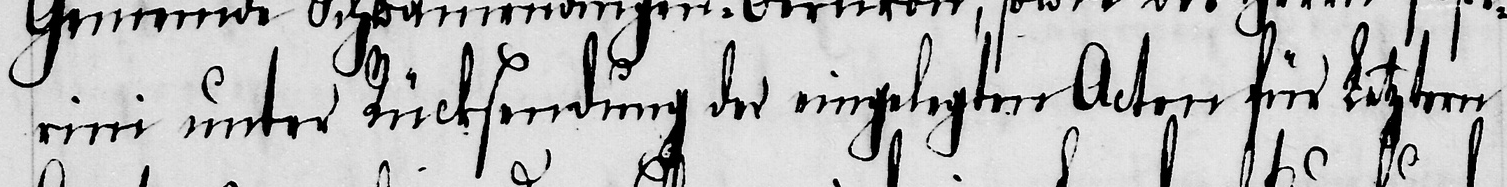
rini unter Rücksendung der eingelegten Acten für Letztern
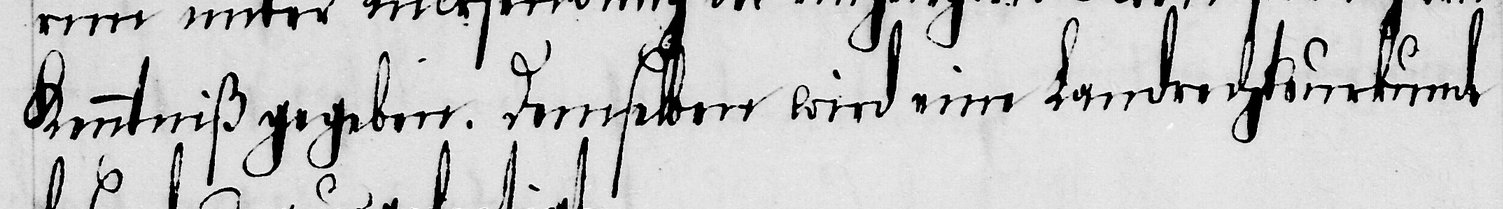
Kenntniß gegeben. Demselben wird eine Landrechtsurkunde
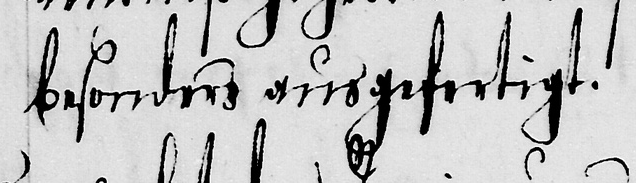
besonders ausgefertigt.
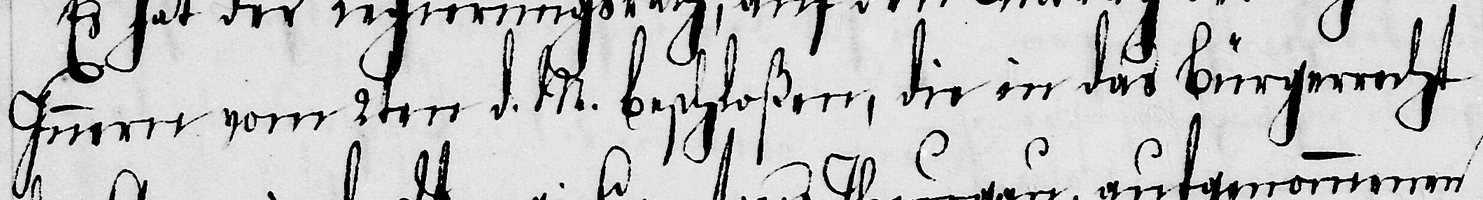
Innern vom 2ten d. M. beschloßen, die in das Bürgerrecht
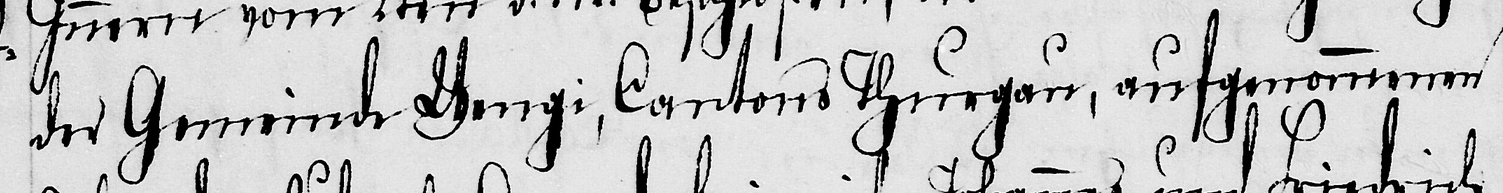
der Gemeinde Wengi, Cantons Thurgau, aufgenommenen
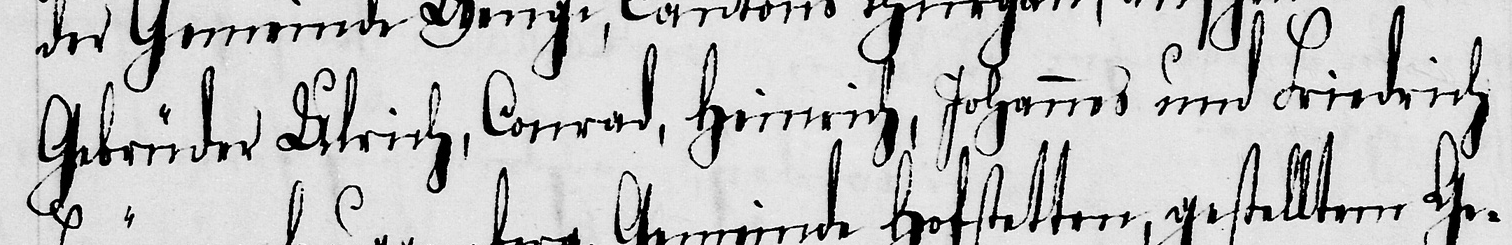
Gebrüder Ulrich, Conrad, Heinrich, Johannes und Friedrich
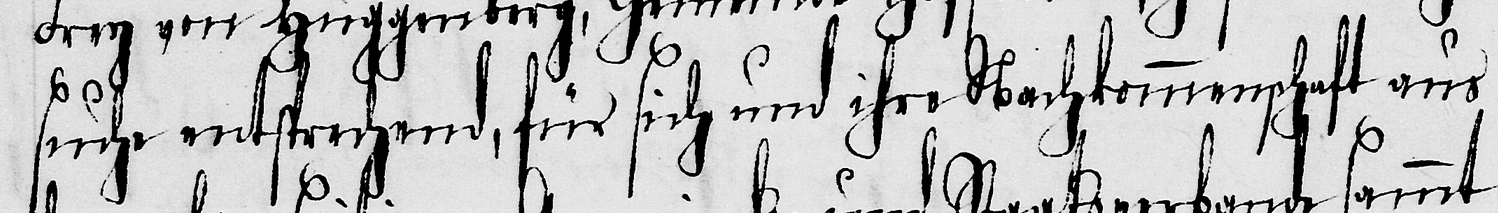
suche entsprechend, für sich und ihre Nachkommenschaft aus
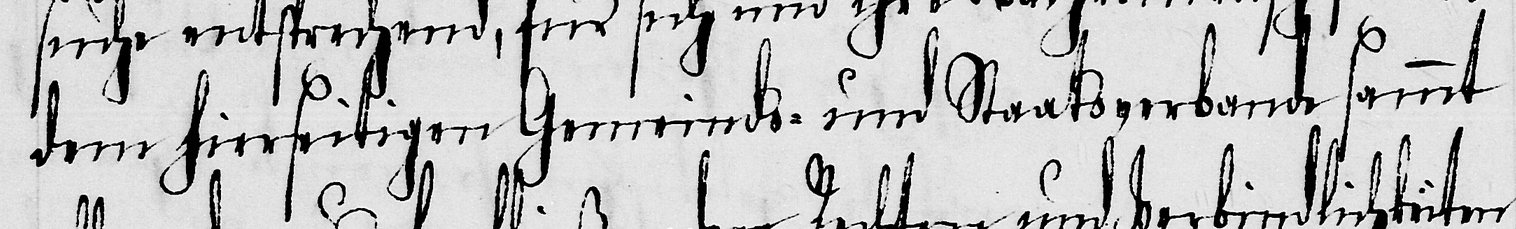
dem hierseitigen Gemeinds- und Staatsverbande sammt
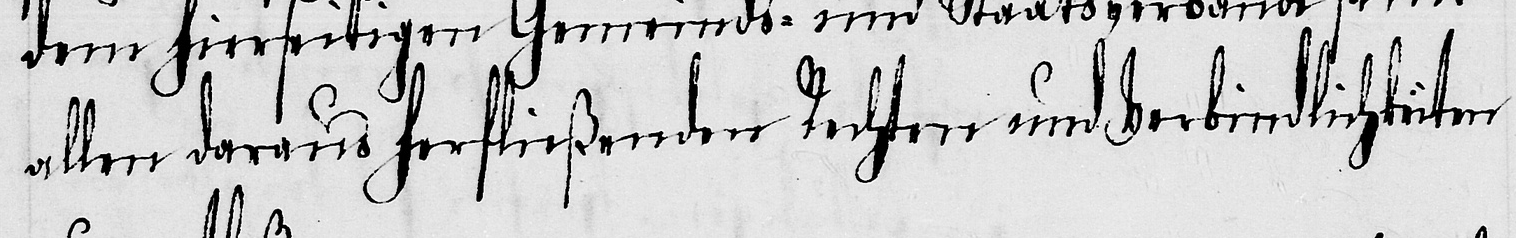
allen daraus herfließenden Rechten und Verbindlichkei¬
